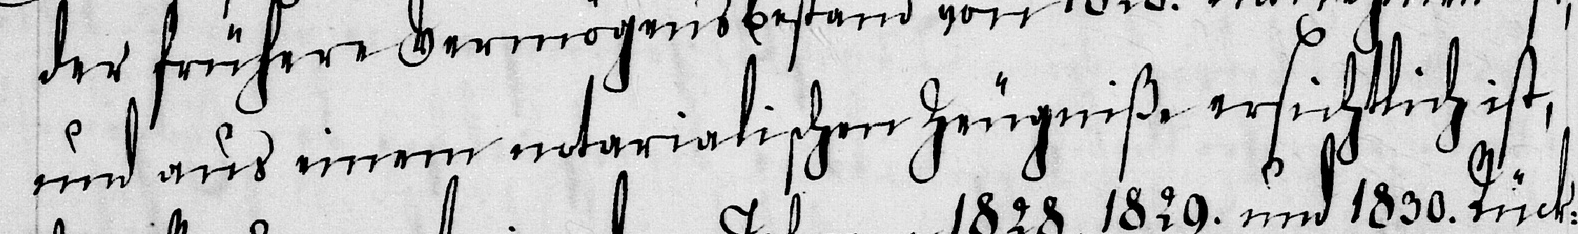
und aus einem notarialischen Zeugniße ersichtlich ist,
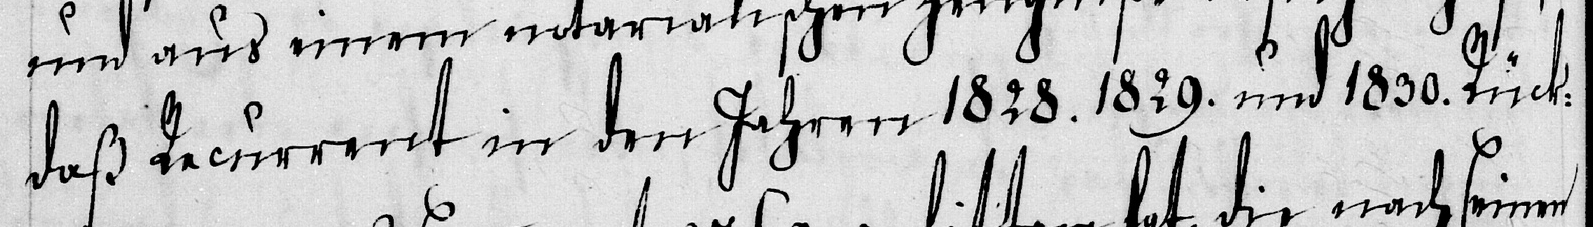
daß Recurrent in den Jahren 1828. 1829. und 1830. Rück¬
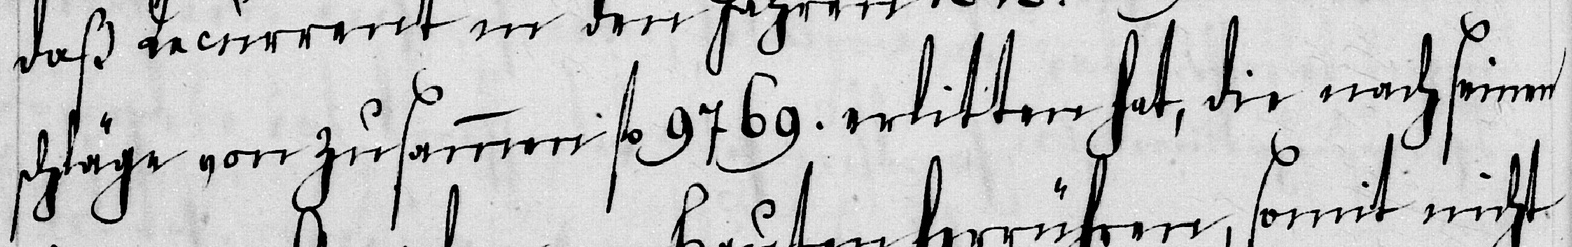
schläge von zusammen fl. 9769. erlitten hat, die nach seinen
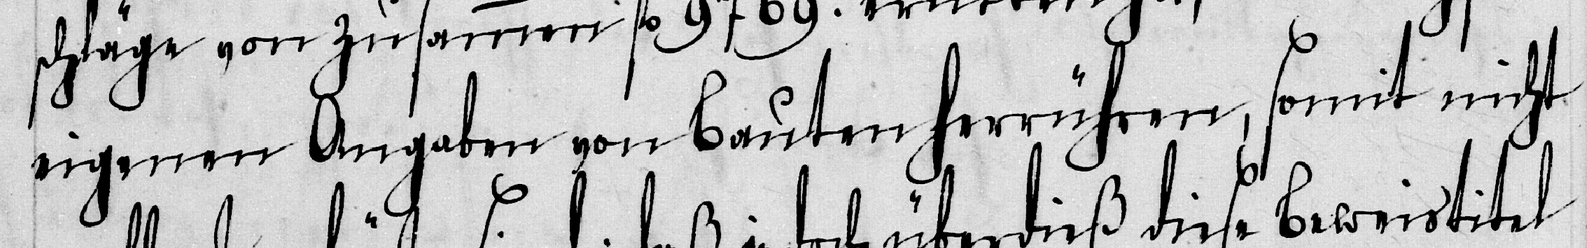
eigenen Angaben von Bauten herrühren, somit nicht
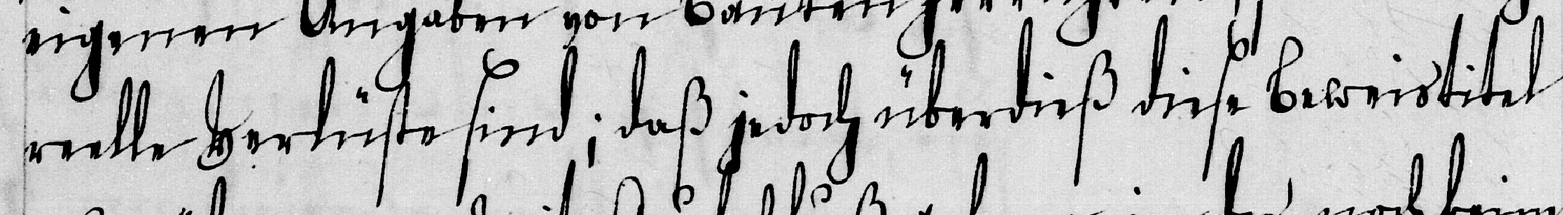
eelle Verlüste sind; daß jedoch überdieß diese Beweistitel
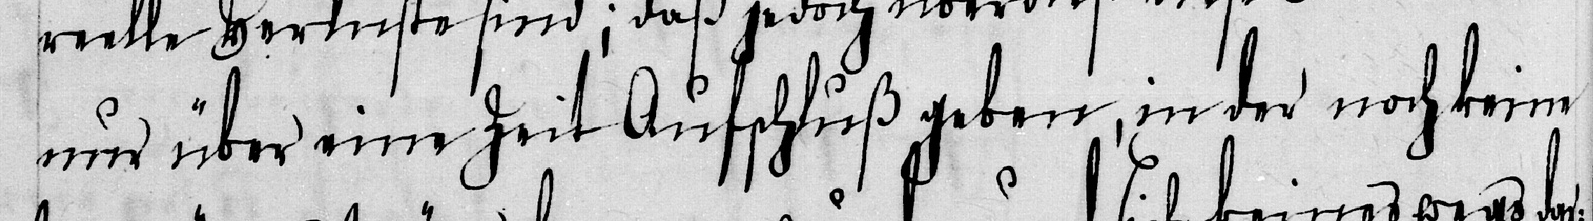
nur über eine Zeit Aufschluß geben, in der noch keine
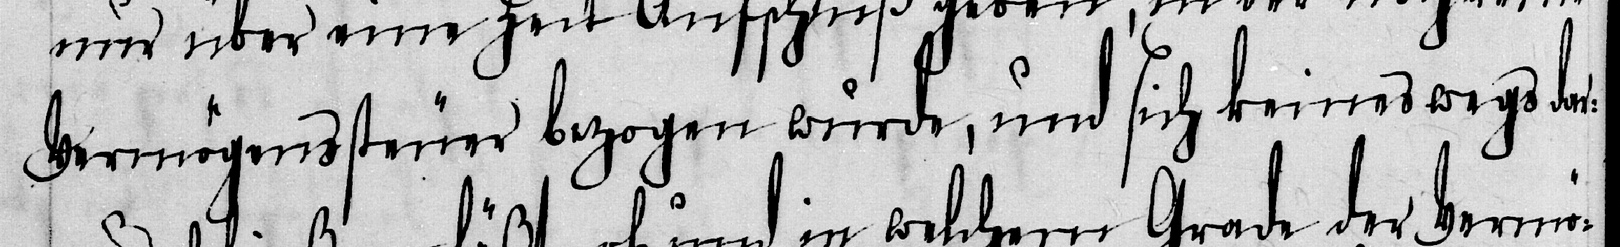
Vermögenssteuer bezogen wurde, und sich keineswegs dar¬
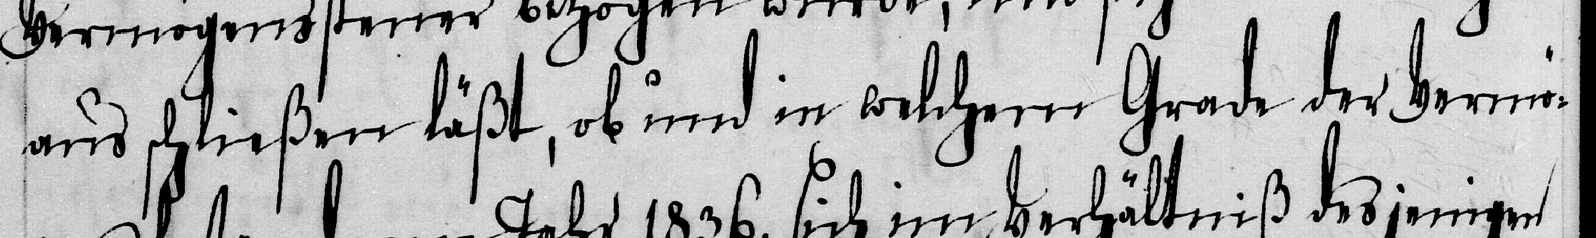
aus schließen läßt, ob und in welchem Grade der Vermö¬
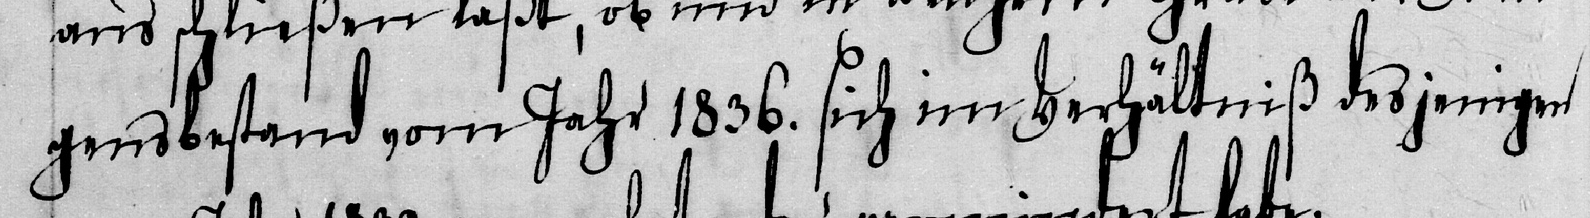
gensbestand vom Jahr 1836. sich im Verhältniß desjenigen
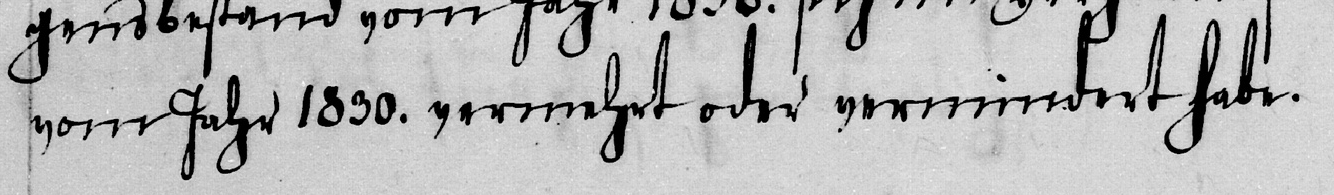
vom Jahr 1830. vermehrt oder vermindert habe.
